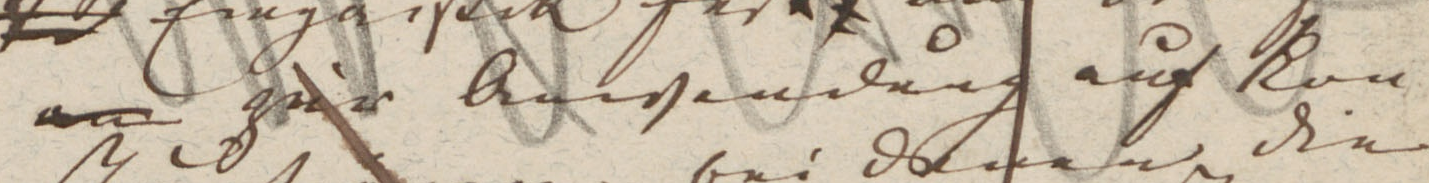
an zur Anwendung auf Kon-
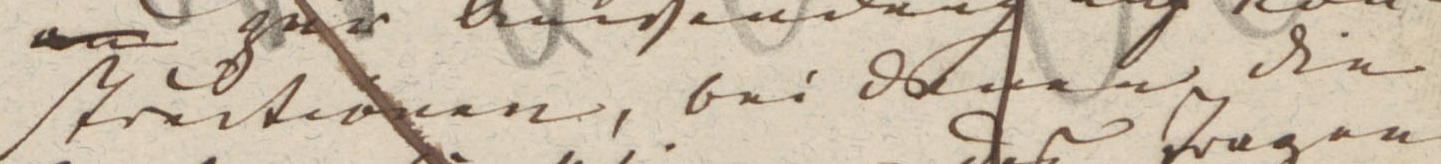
structionen, bei denen die
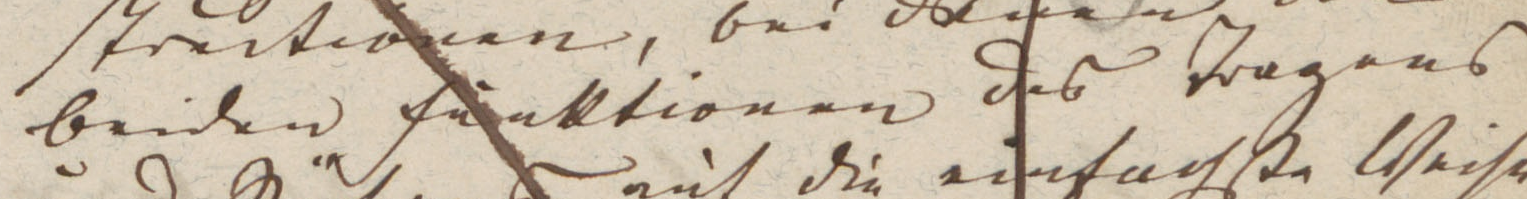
beiden Funktionen des Tragens
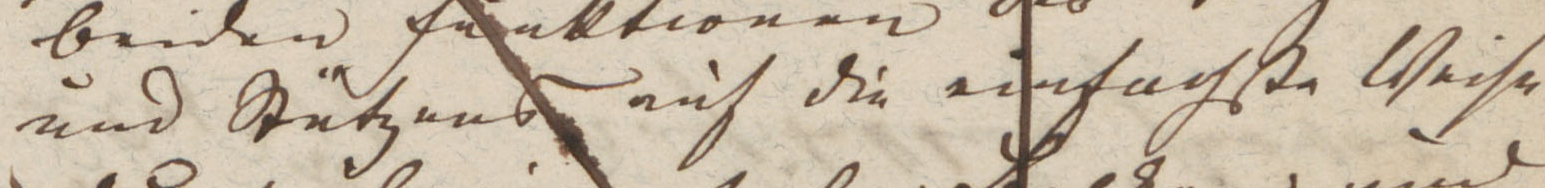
und Stützens auf die einfachste Weise
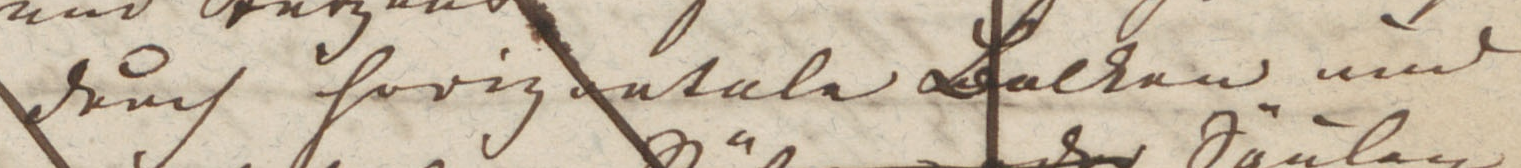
durch horizontale Balken und
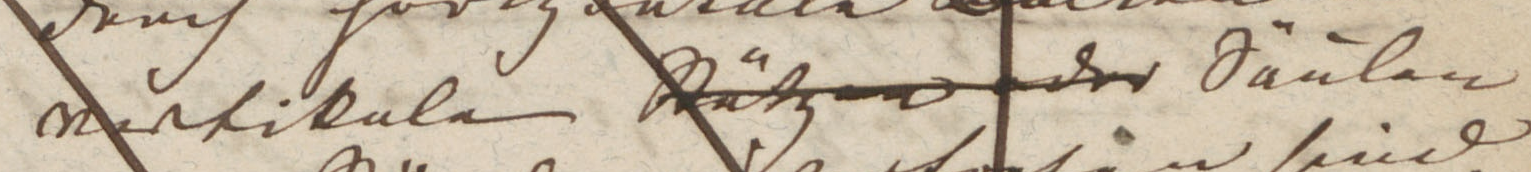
vertikale Stützen oder Säulen
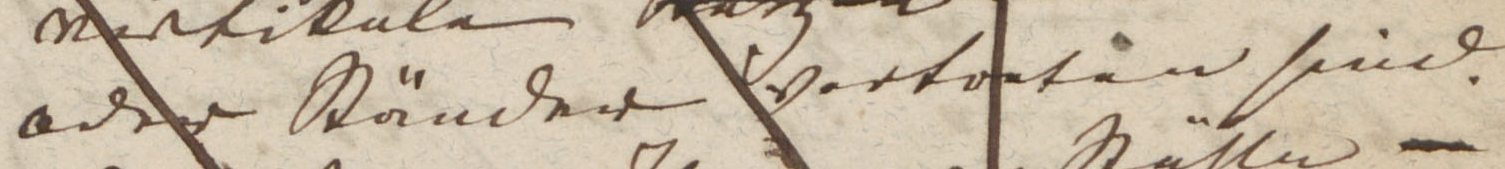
oder Ständer vertreten sind.
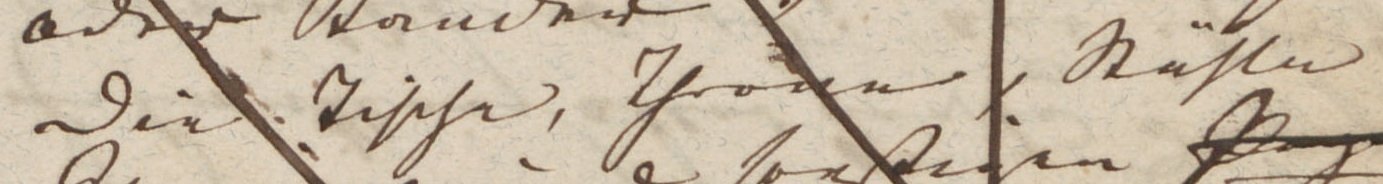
Die Tische, Throne, Stühle
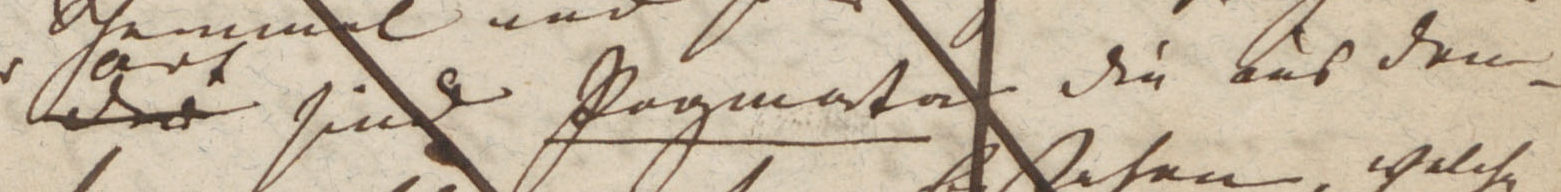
der der Art sind Pegmata die aus den-
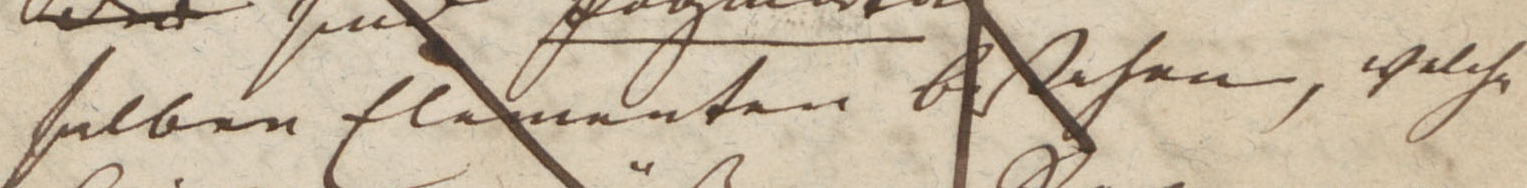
selben Elementen bestehen, welche
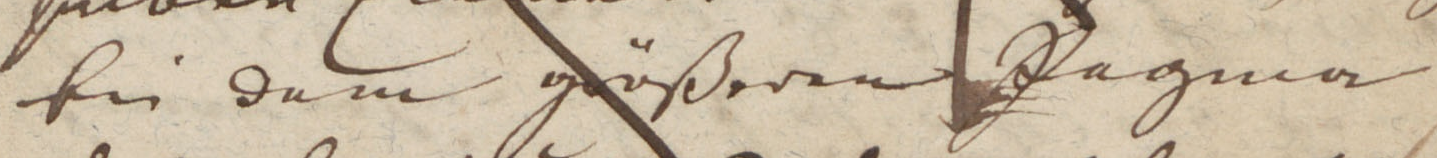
bei dem grösseren Pagma
